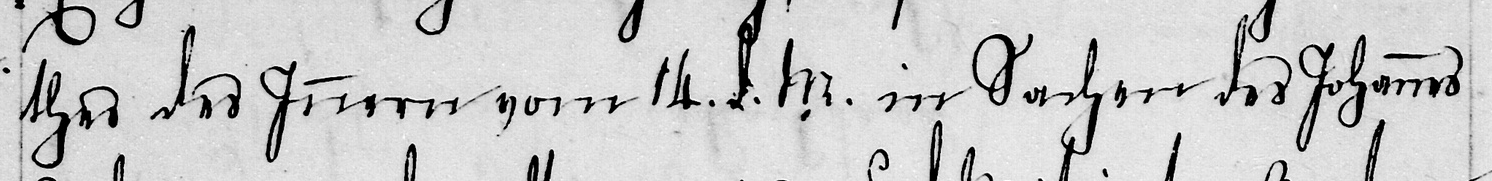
thes des Innern vom 14. d. M. in Sachen des Johannes
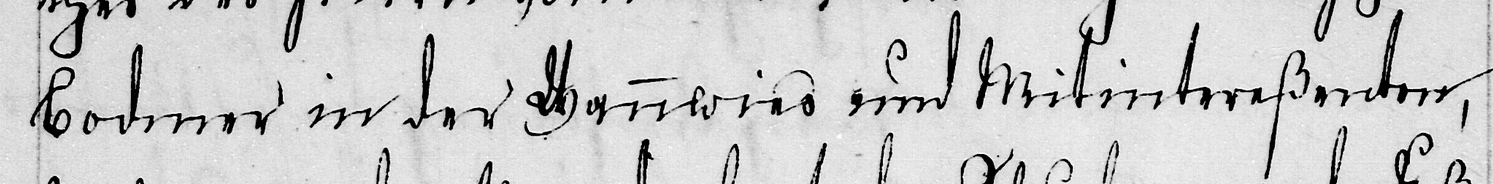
Bodmer in der Wannwies und Mitintereßenten,
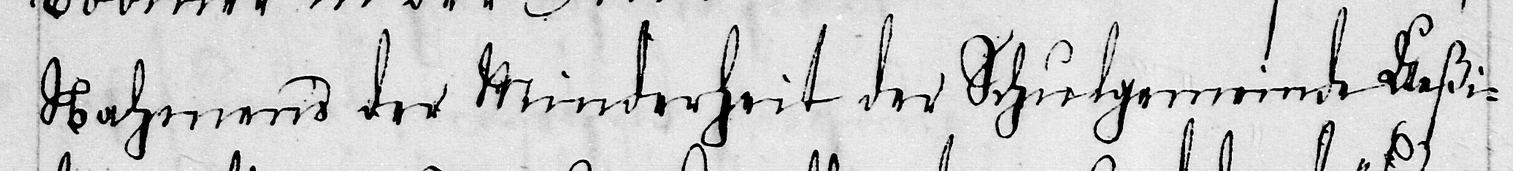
Nahmens der Minderheit der Schulgemeinde Ueßi¬
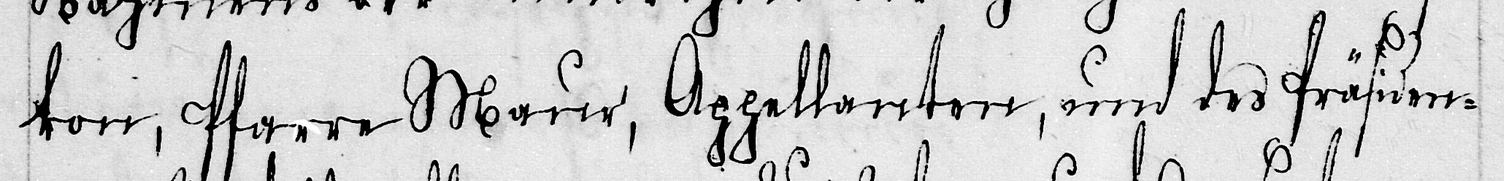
kon, Pfarre Maur, Appellanten, und des Präsiden¬
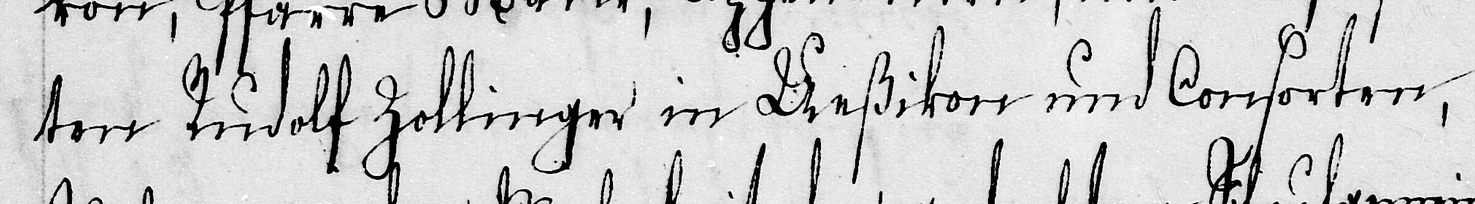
ten Rudolf Zollinger in Ueßikon und Consorten,
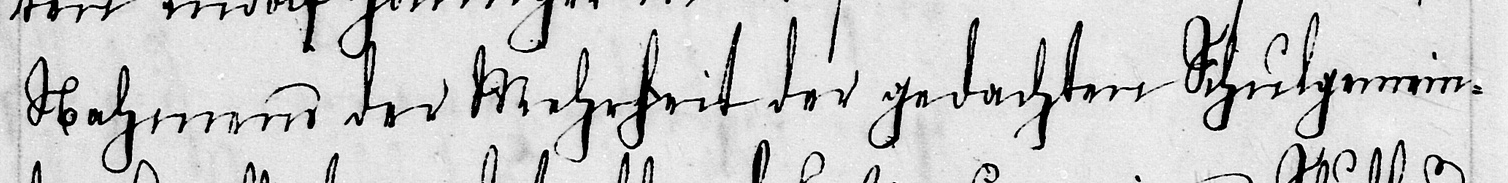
Nahmens der Mehrheit der gedachten Schulgemein¬
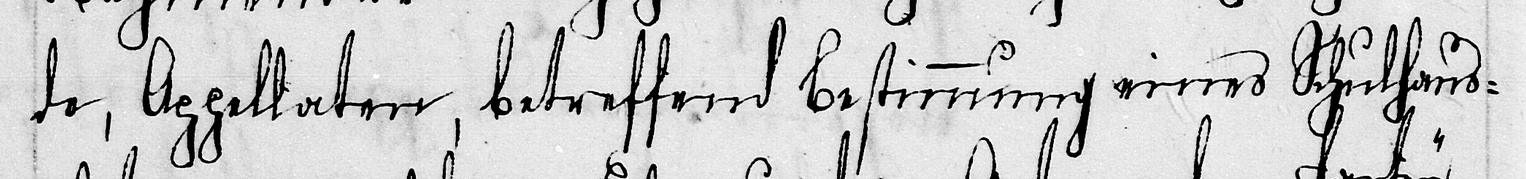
de, Appellaten, betreffend Bestimmung eines Schulhaus¬
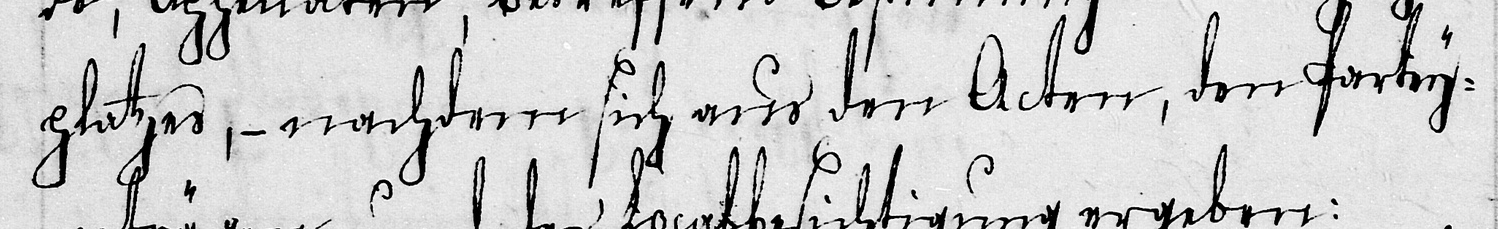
platzes, – nachdem sich aus den Acten, den Partey¬
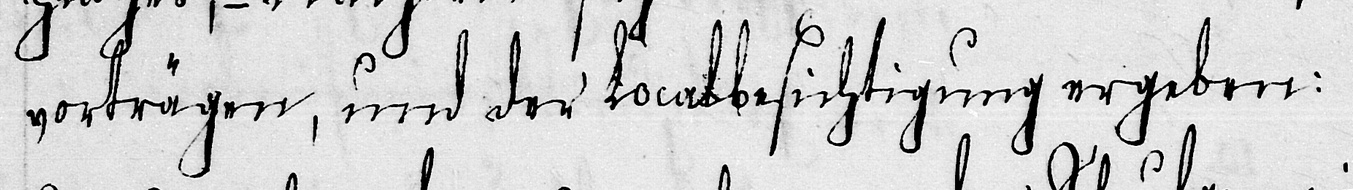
vorträgen, und der Localbesichtigung ergeben:
